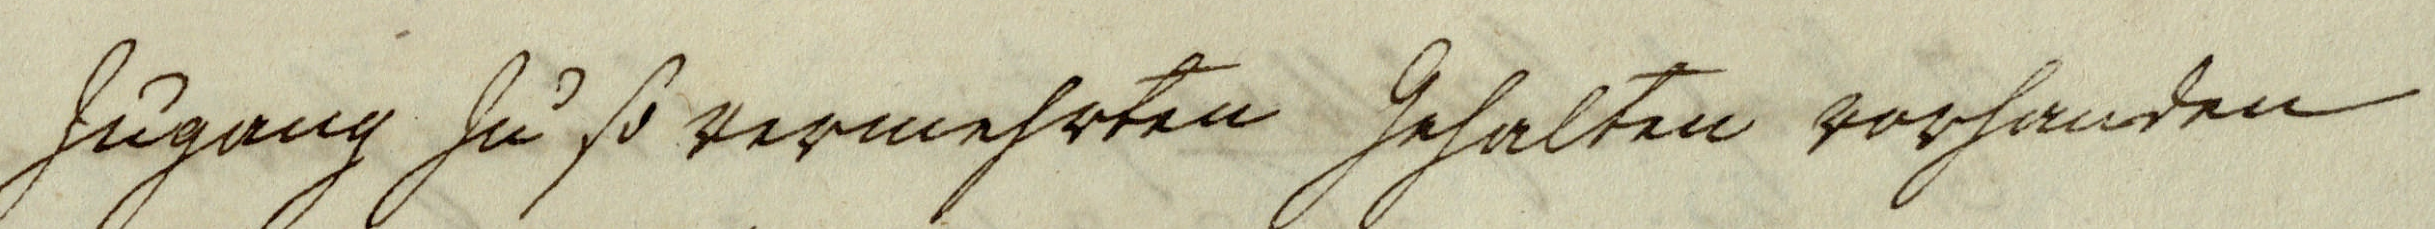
Zugang zu so vermehrten Gehalten vorhanden
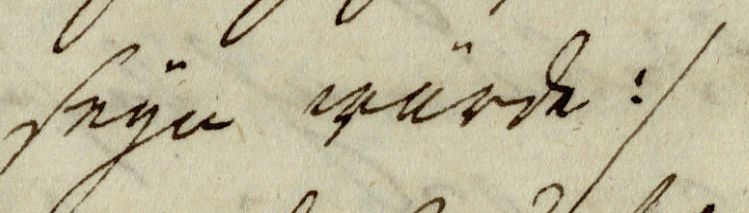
seÿn würde :/
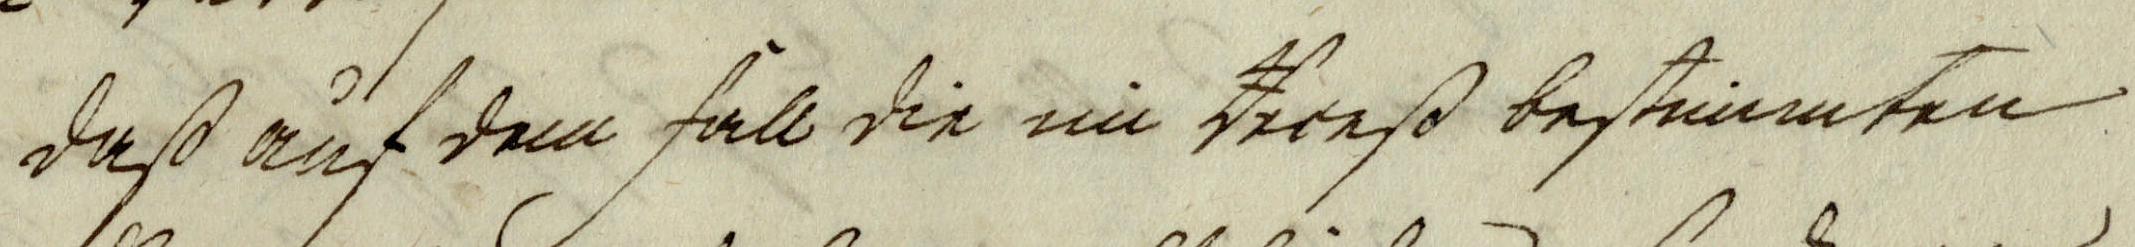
daß auf dem Fall die im Receß bestimmten
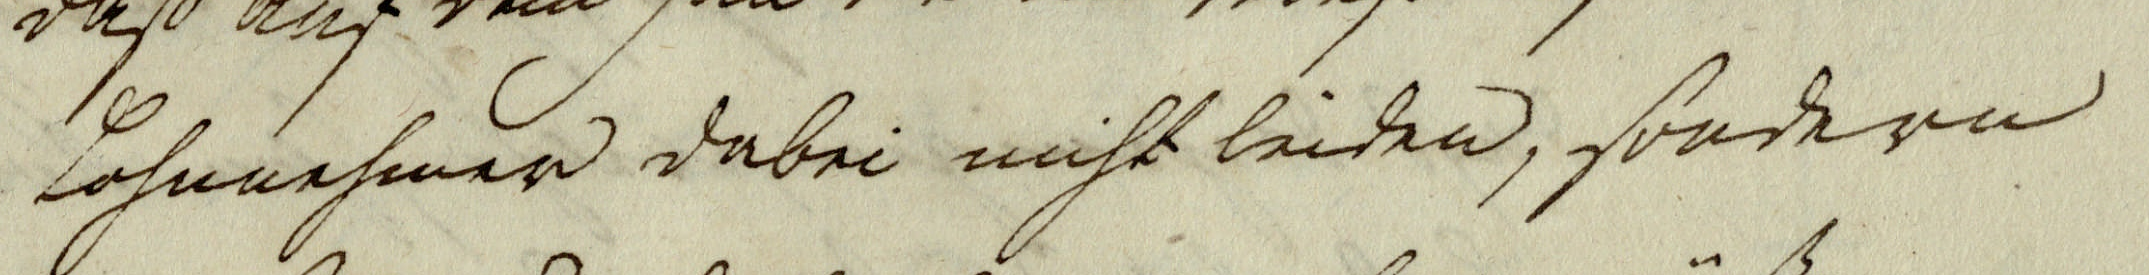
Lohnnehmer dabei nicht leiden, sondern
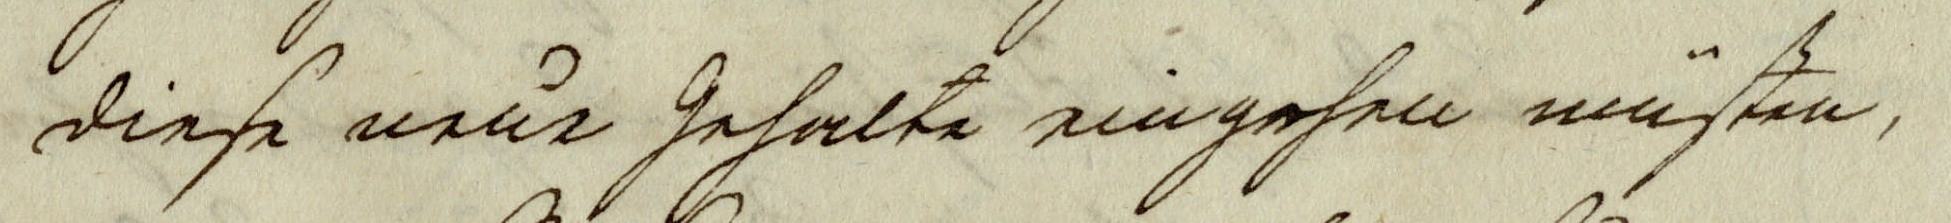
diese neue Gehalte eingehen müssten.
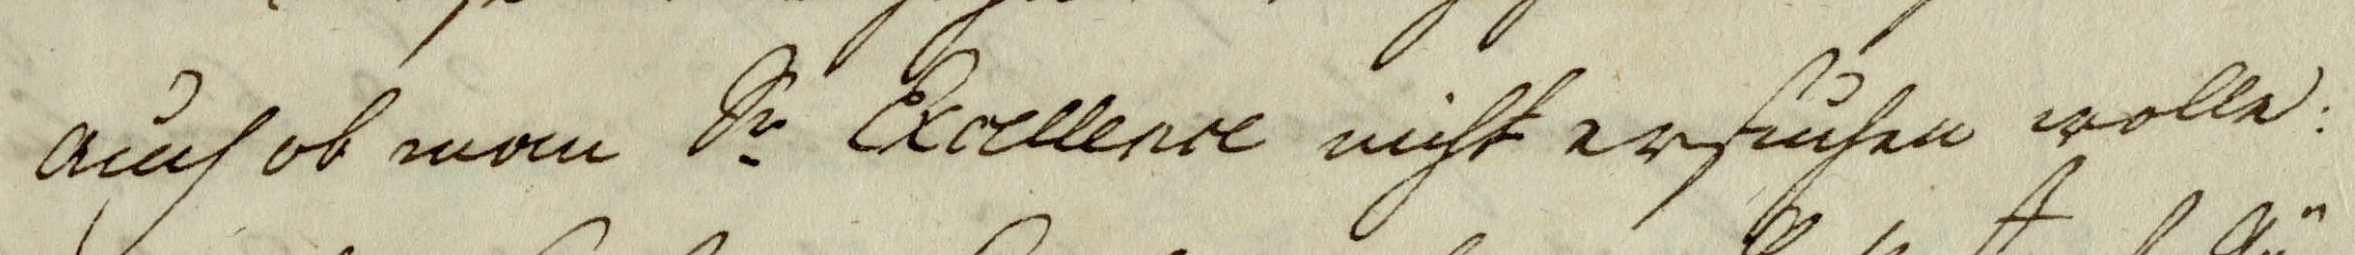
auch ob man Sr. Excellence nicht ersuchen wolle:
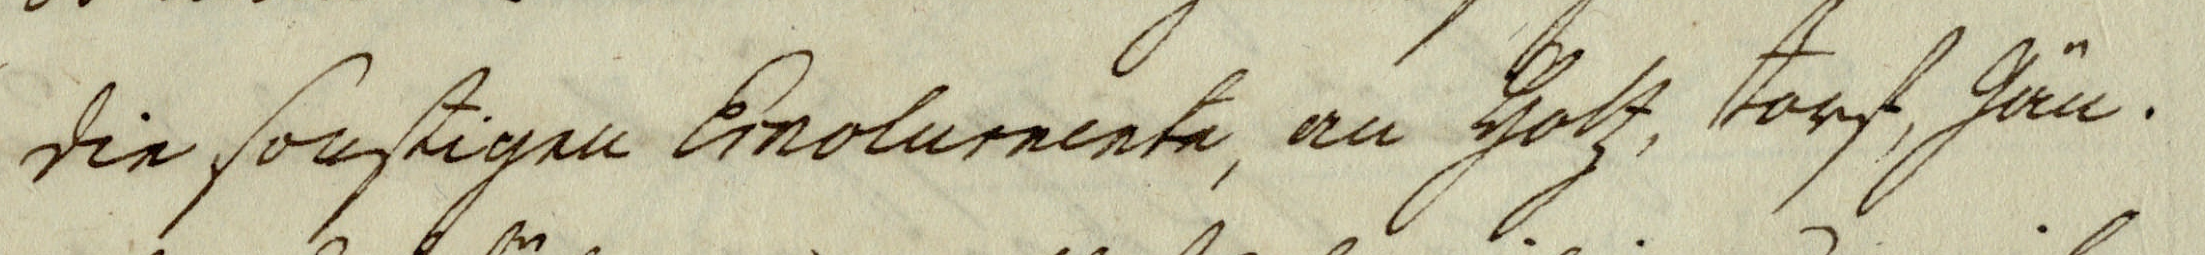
die sonstigen Emolumente, an Holtz, Torf, Gän¬
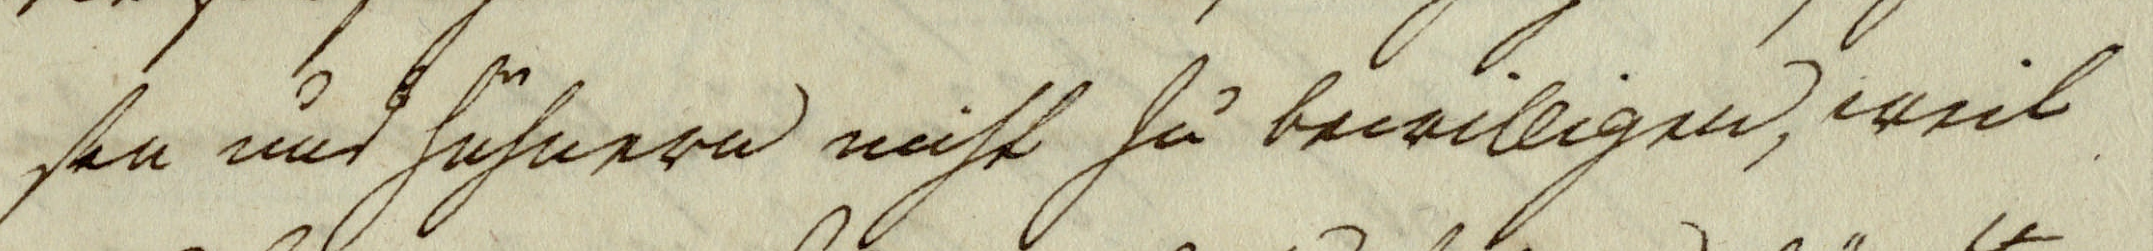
sen und Hühnern nicht zu bewilligen, weil
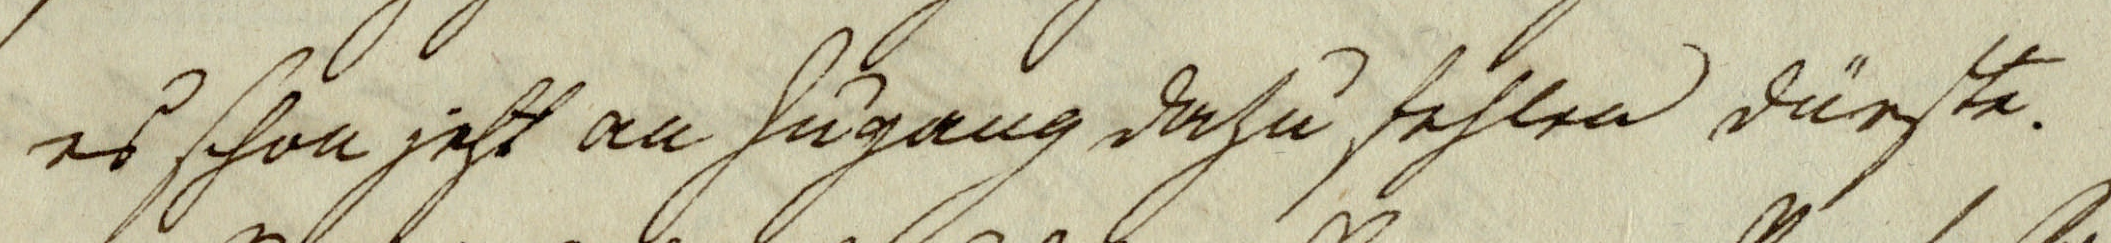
es schon jetzt an Zugang dazu fehlen dürfte.
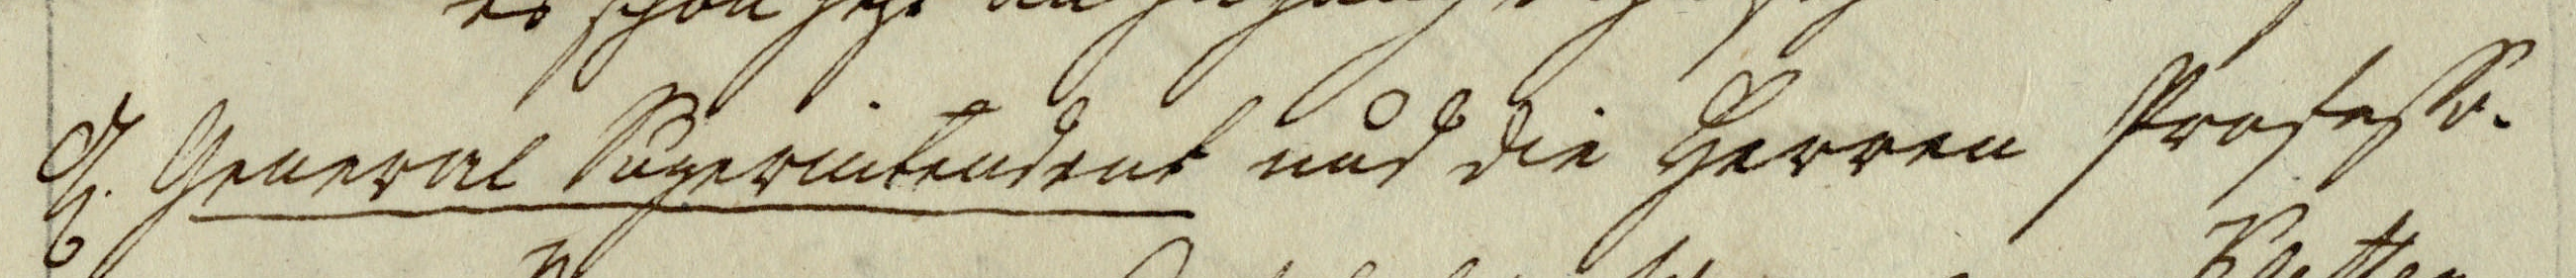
dh. General Superintendent und die Herren Professo¬
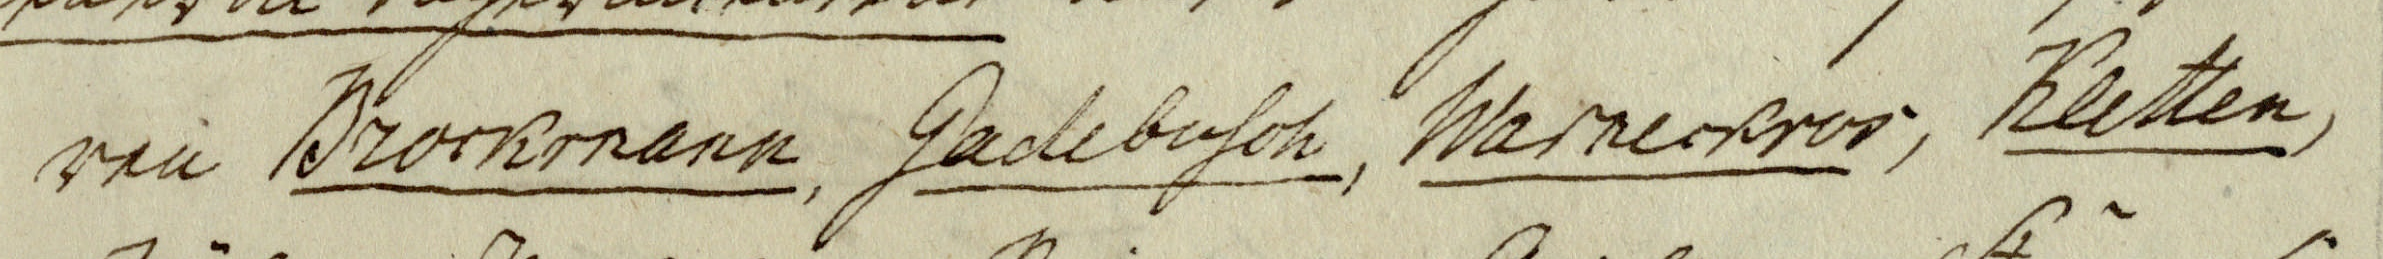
ren Brockmann, Gadebusch, Warneckros, Kletten,
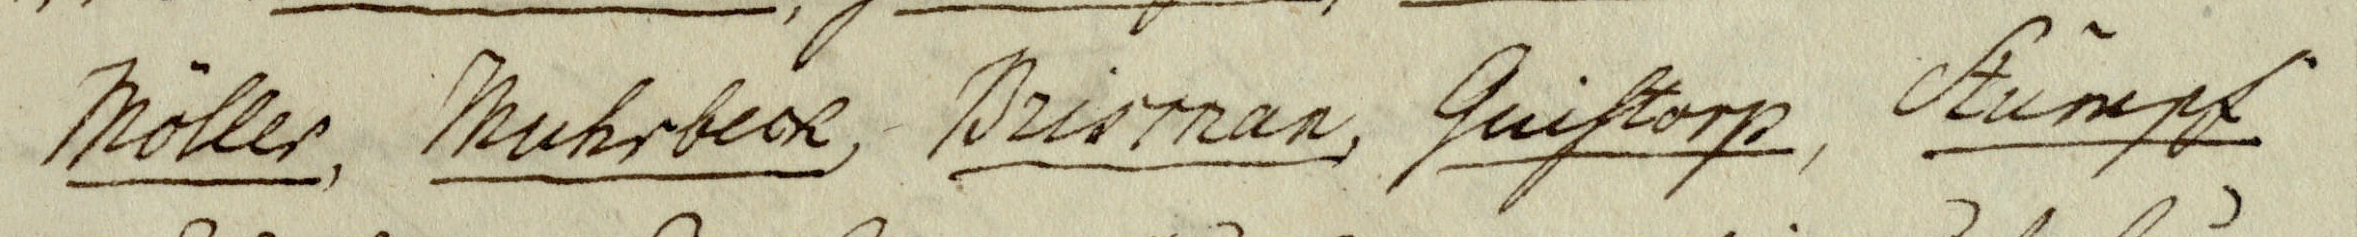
Möller, Muhrbeck, Brisman, Quistorp, Stumpf
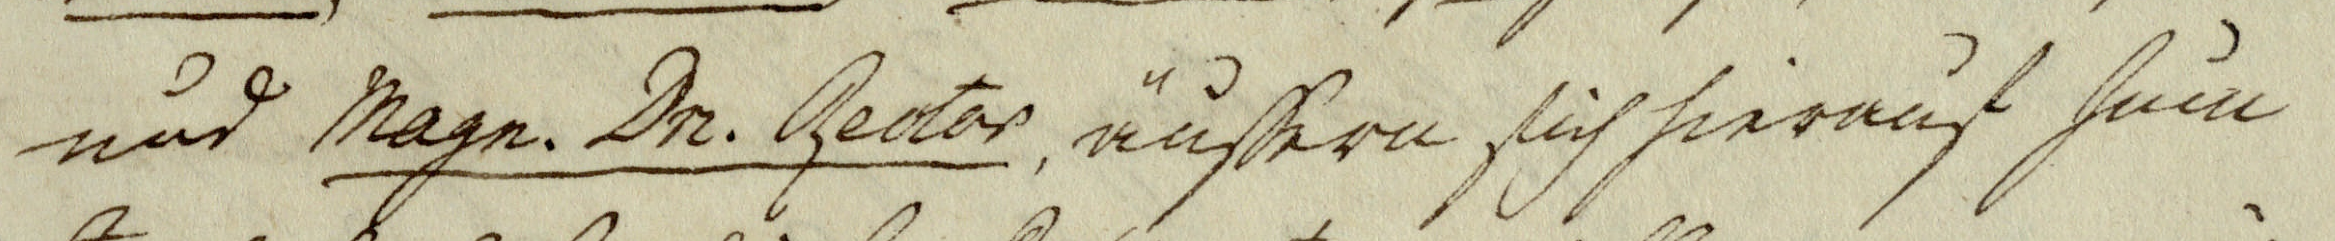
und Magn. Dn. Rector, äußern sich hierauf zum
